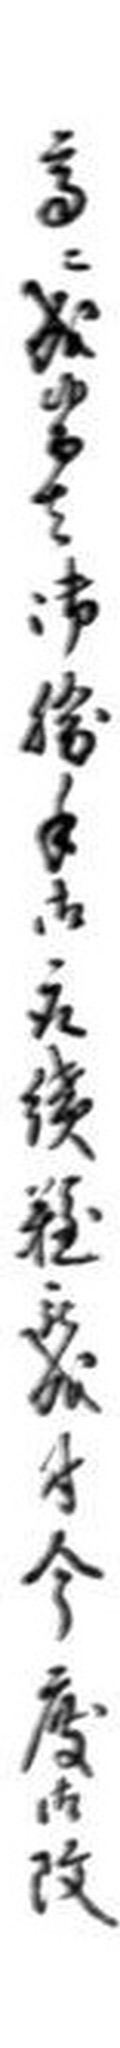高ニ成候而者御勝手御取続難被成付今度御改
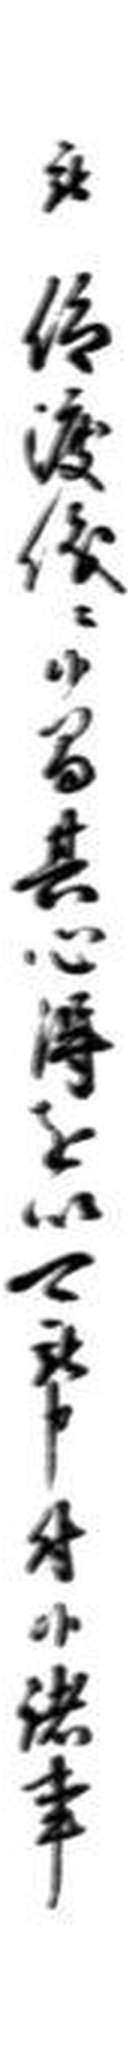被仰渡儀ニ候間其心得を以可被申付候諸事
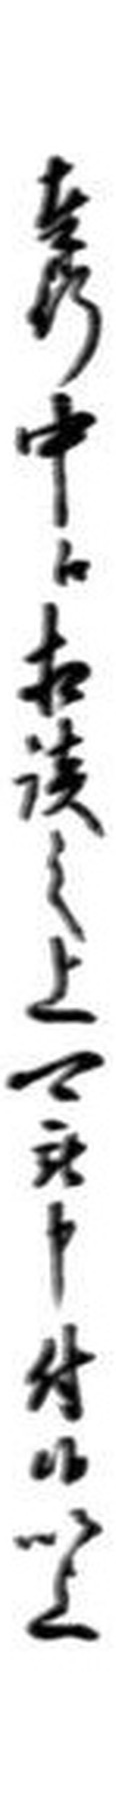奉行中江相談之上可被申付候以上
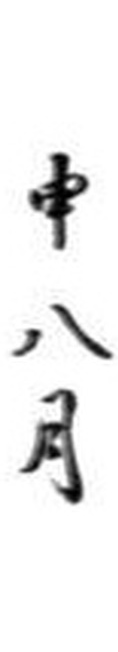申八月
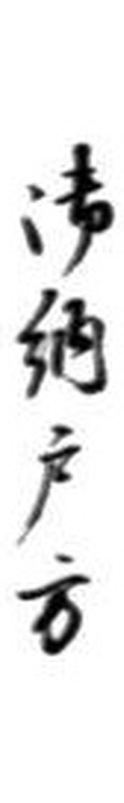御納戸方
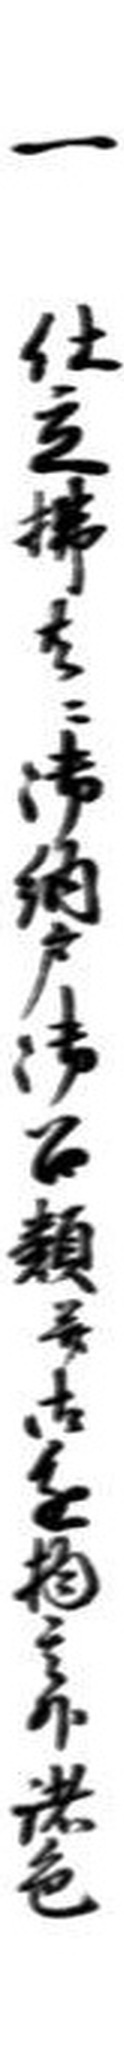一仕立払共ニ御納戸御召類并御進物其外諸色
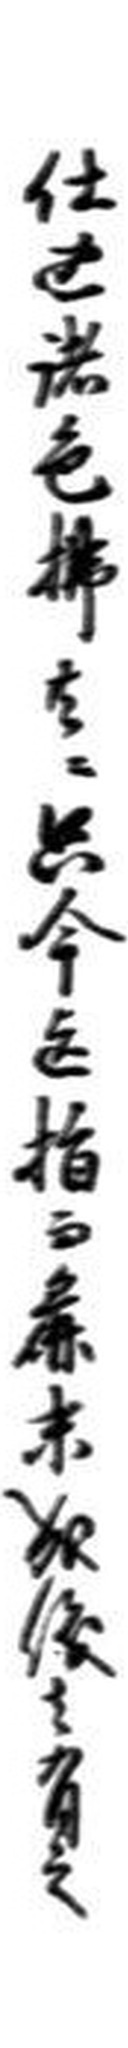仕込諸色払共ニ只今迄指而麁末成儀者有之
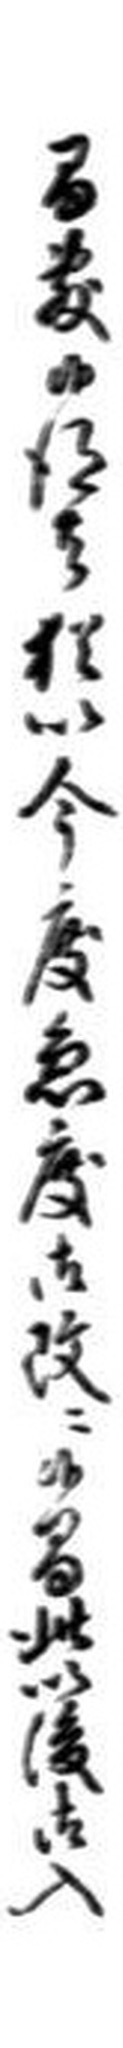間敷候得共猶以今度急度御改ニ候間此以後御入
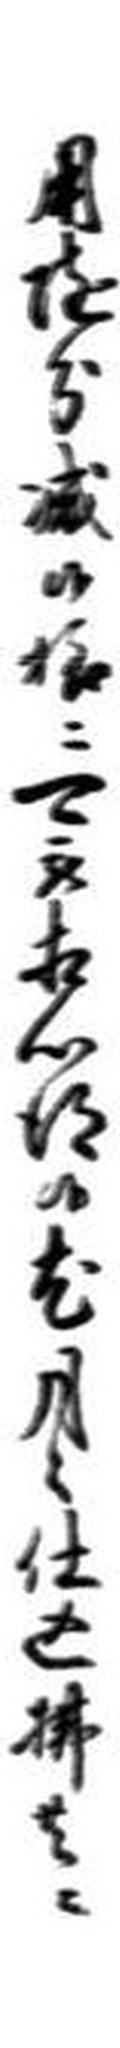用随分減候様ニ可被相心得候尤月々仕込払共ニ

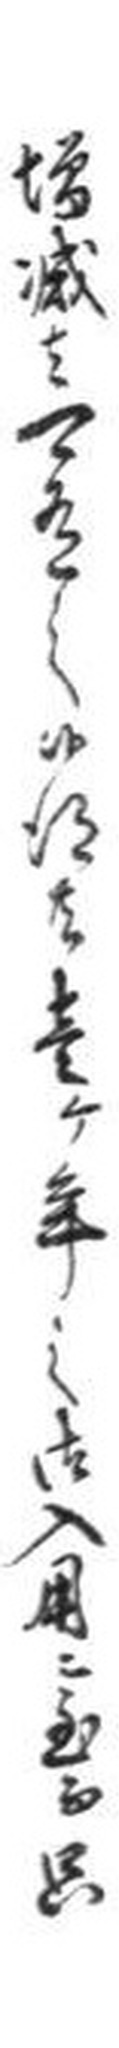増減者可有之候得共壱ヶ年之御入用ニ至而只
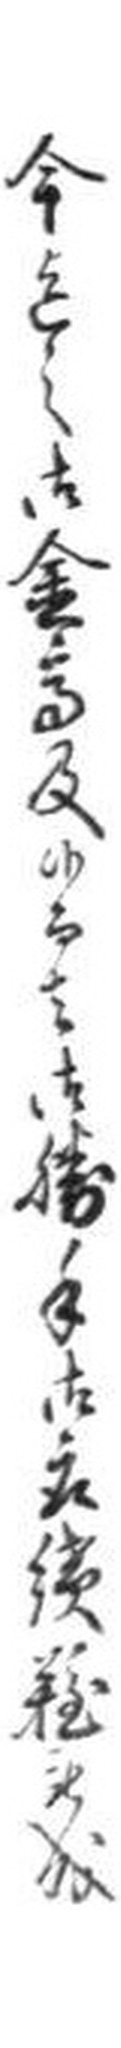今迄之御金高及候而者御勝手御取続難被成
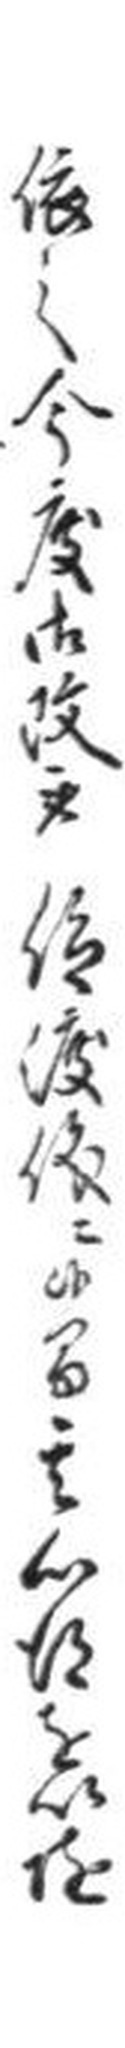依之今度御改被仰渡儀ニ候間其心得を以随
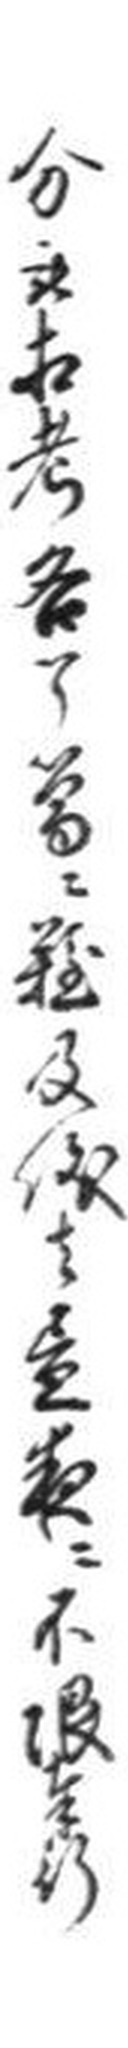分被相考各了簡ニ難及儀者昼夜ニ不限奉行
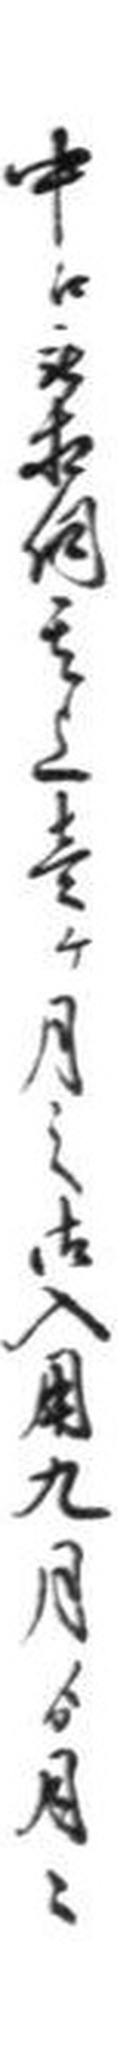中江被相伺其上壱ヶ月之御入用九月ゟ月々
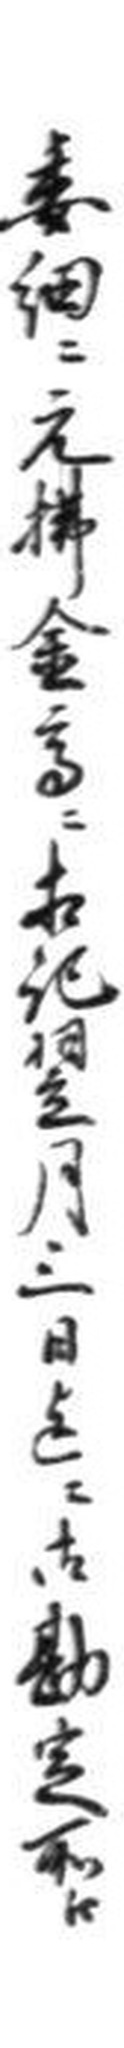委細ニ元払金高ニ相記翌月三日迄ニ御勘定所江
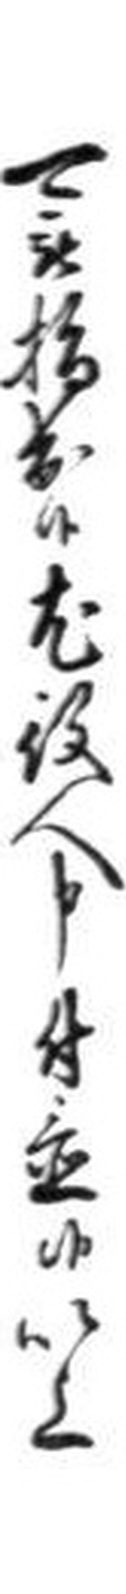可被指出候尤役人申付置候以上
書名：家譜 三十一 吉邦公 享保元年
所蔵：福井県文書館 Fukui Prefectural Archives
